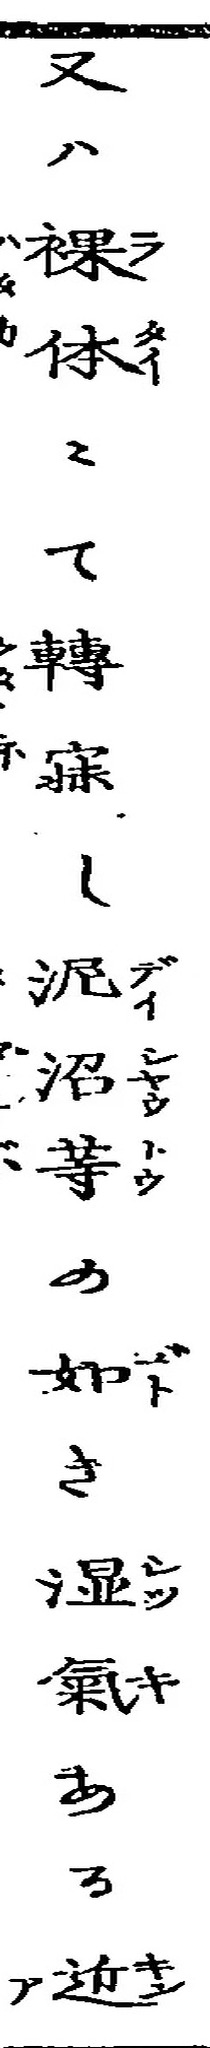又は裸体にて轉寐し泥沼等の如き湿気ある近
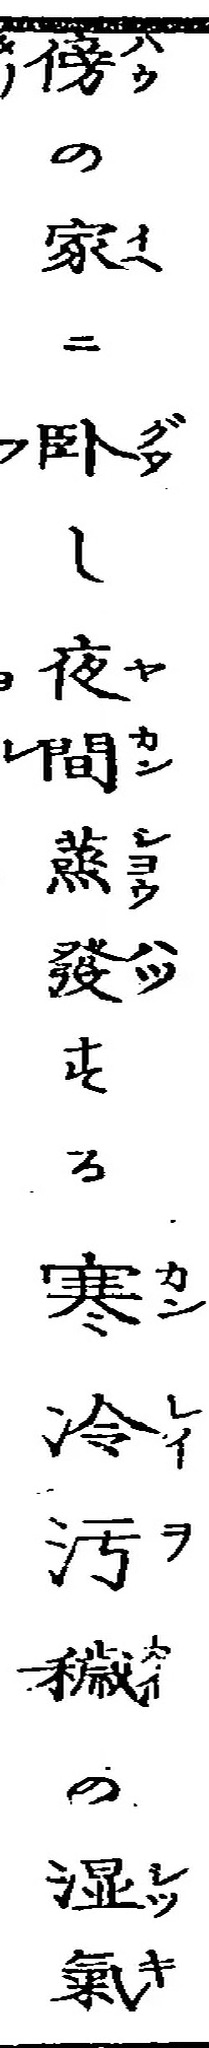傍の家に臥し夜間蒸発する寒冷汚穢の湿気
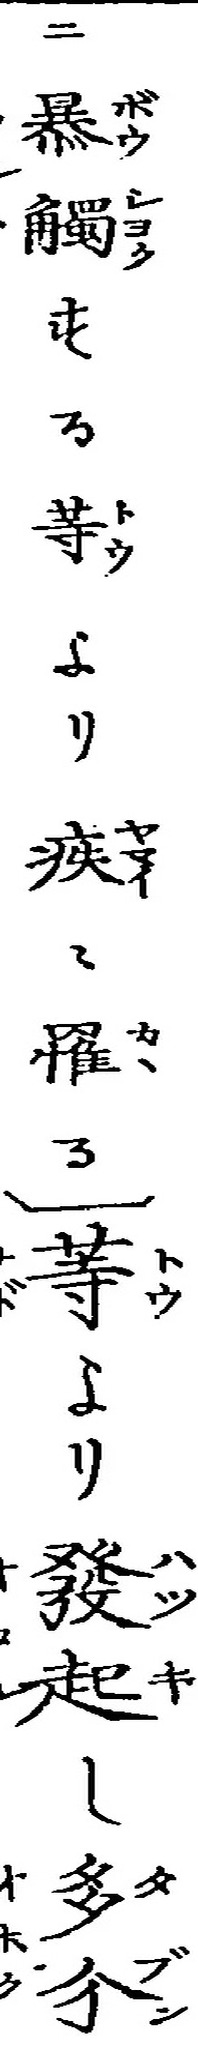に暴触する等より疾に罹る]等より発起し多分
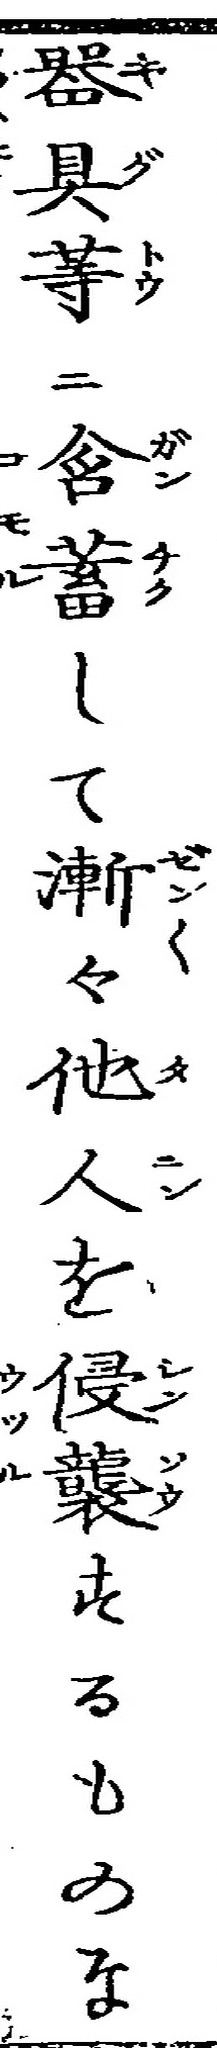器具等に含蓄して漸々他人を侵襲するものな
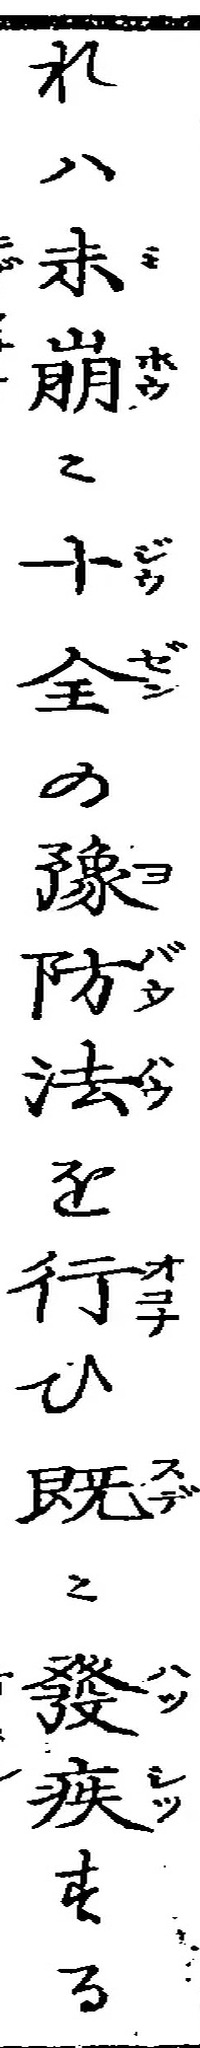れは未崩に十全の予防法を行ひ既に発疾する
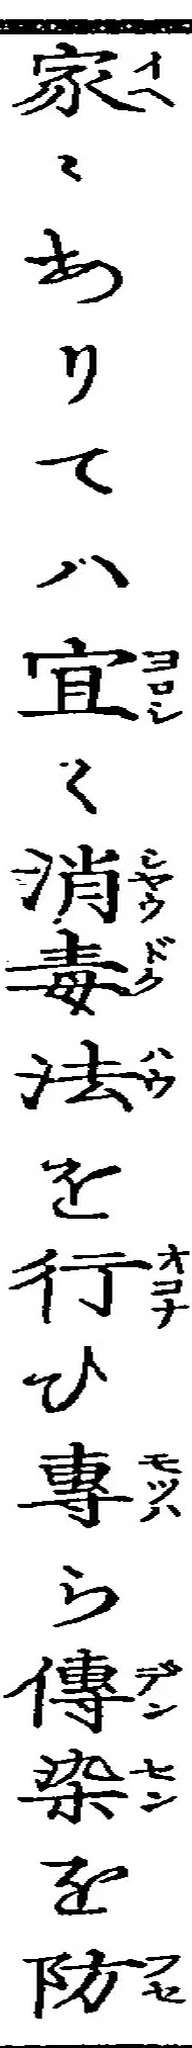家にありては宜く消毒法を行ひ専ら伝染を防

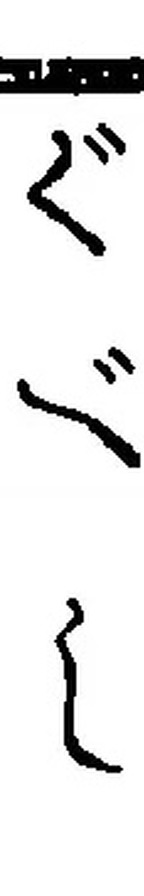ぐべし
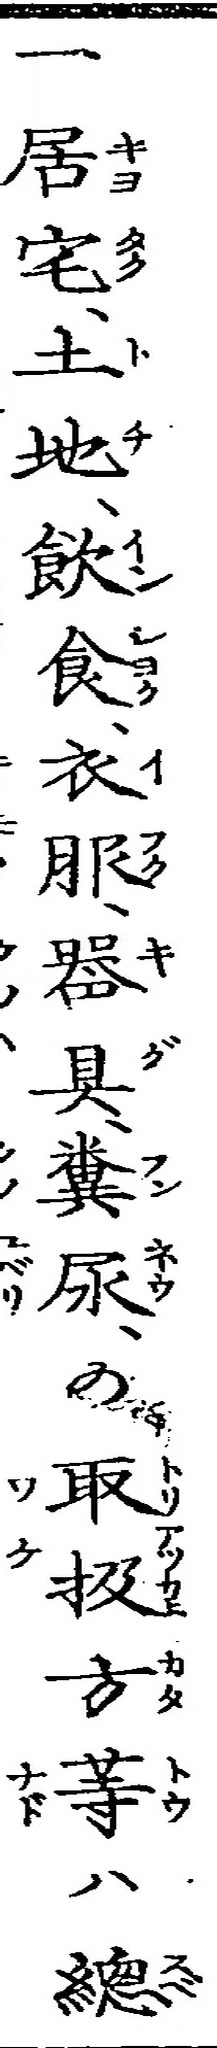一居宅、土地、飲食、衣服、器具、糞尿、の取扱等は総
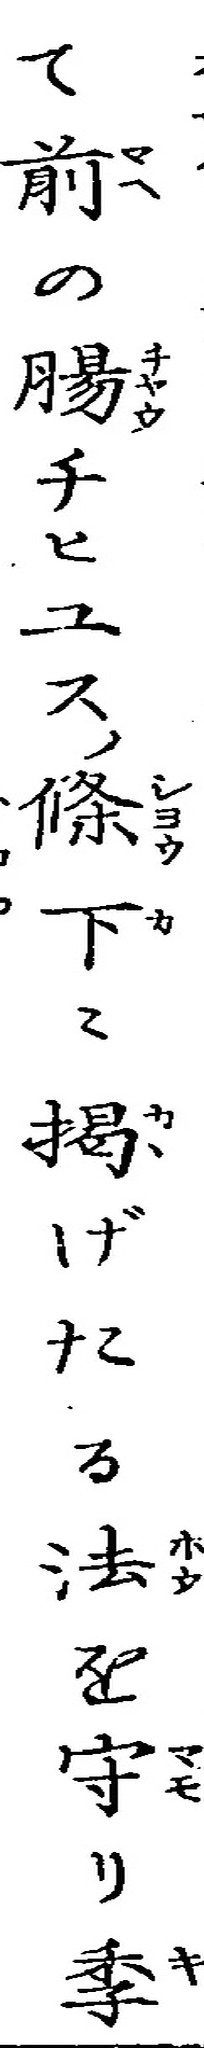て前の腸チヒユスノ条下に掲げたる法を守り季
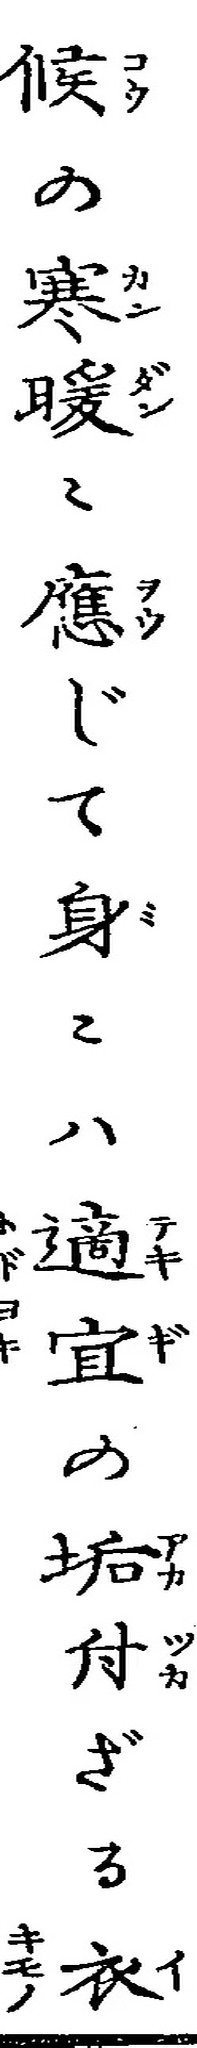候の寒暖に応じて身には適宜の垢付ざる衣
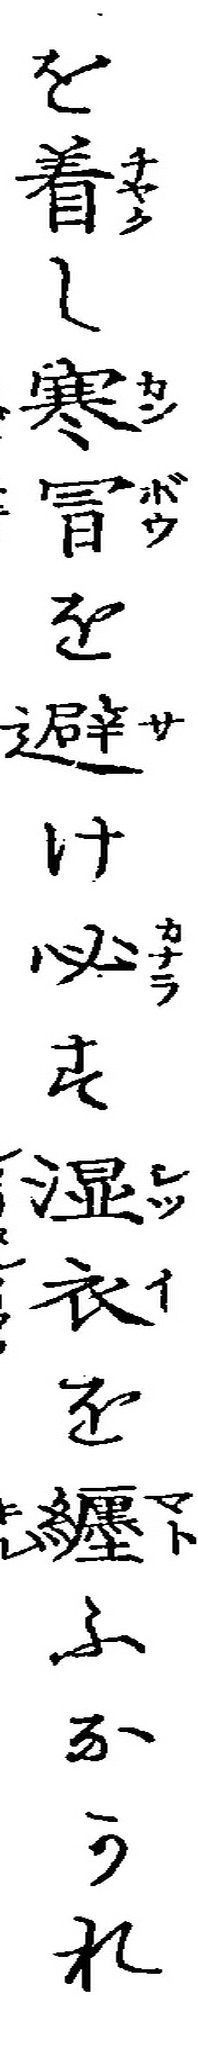を着し寒冒を避け必す湿衣を纏ふなかれ
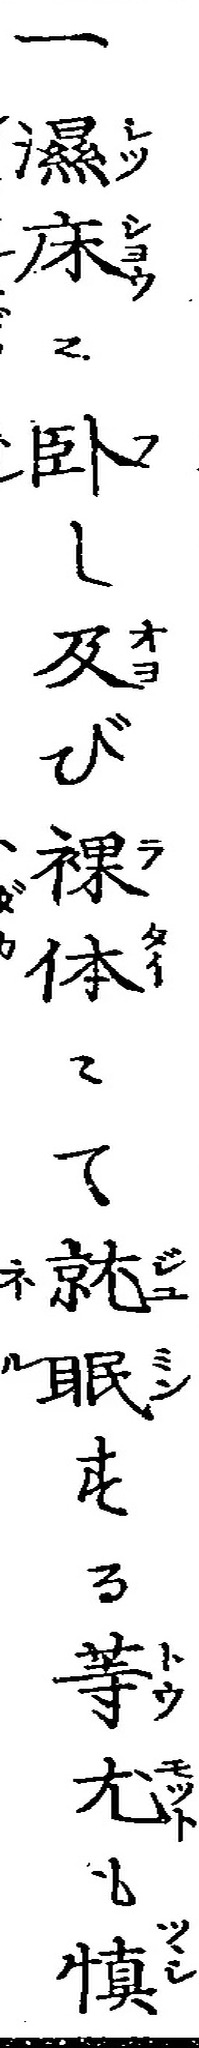一湿床に臥し及び裸体にて就眠する等尤も慎
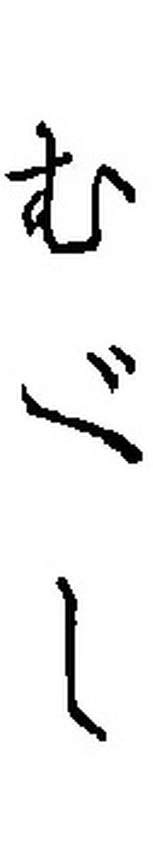むべし
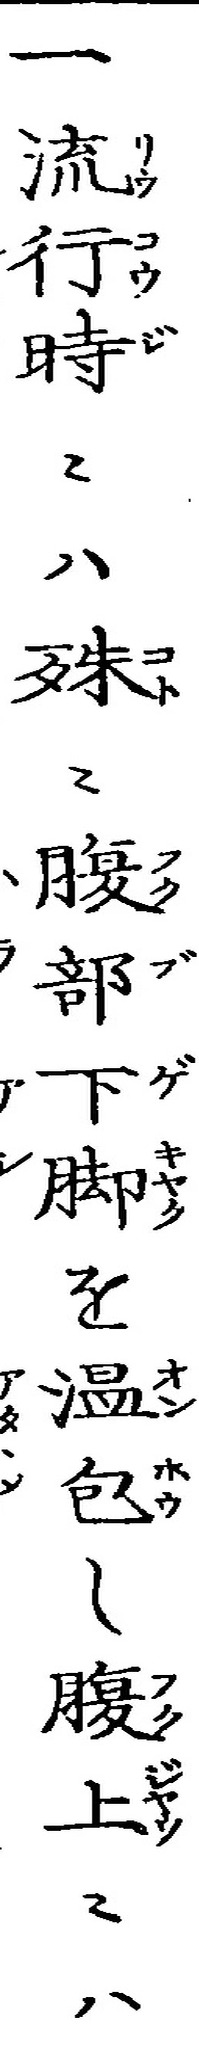一流行時には殊に腹部下脚を温包し腹上には
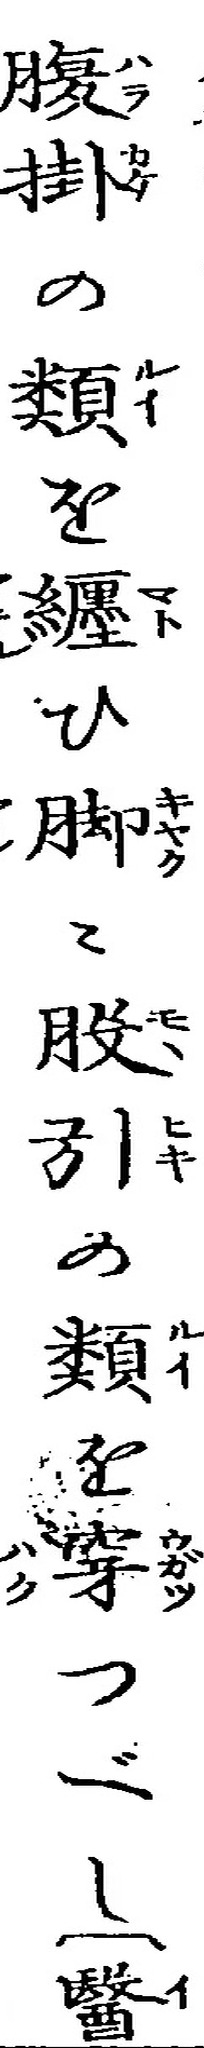腹掛の類を纏ひ脚に股引の類を穿つべし[医
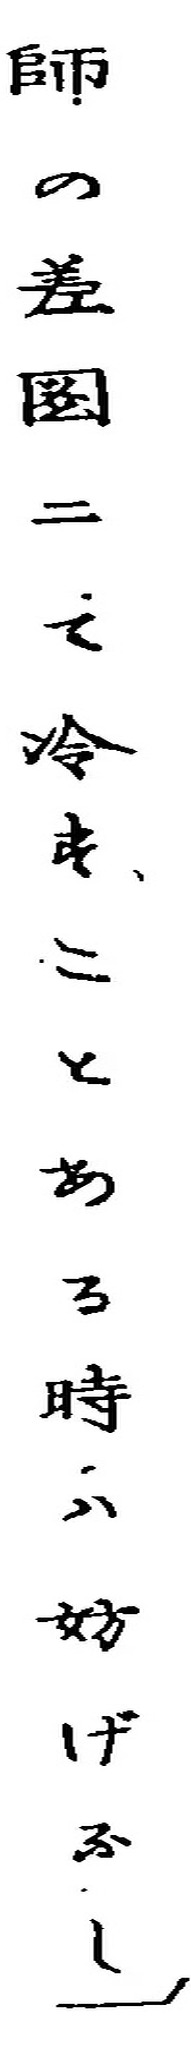師の差図にて冷すことある時は妨げなし]
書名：伝染病予防法
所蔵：国立国会図書館 National Diet Library, JAPAN
